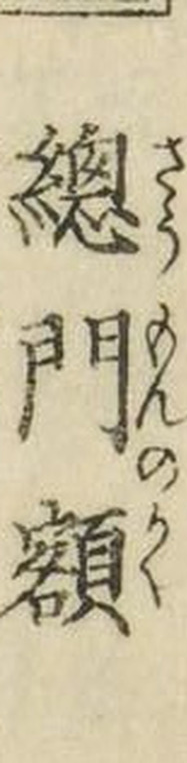總門額
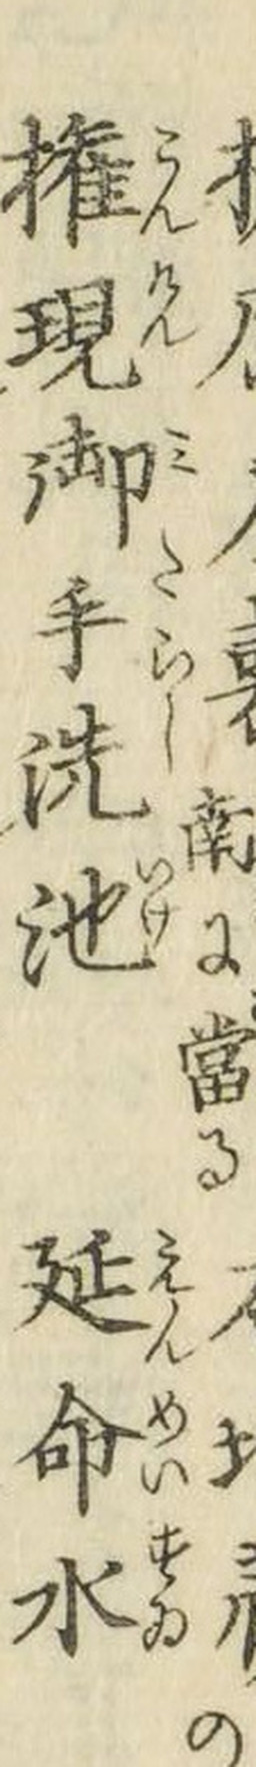権現御手洗池延命水
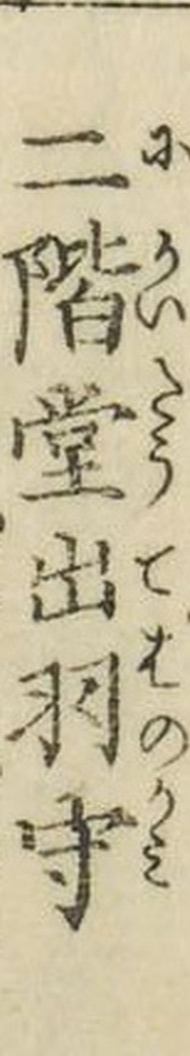二階堂出羽守
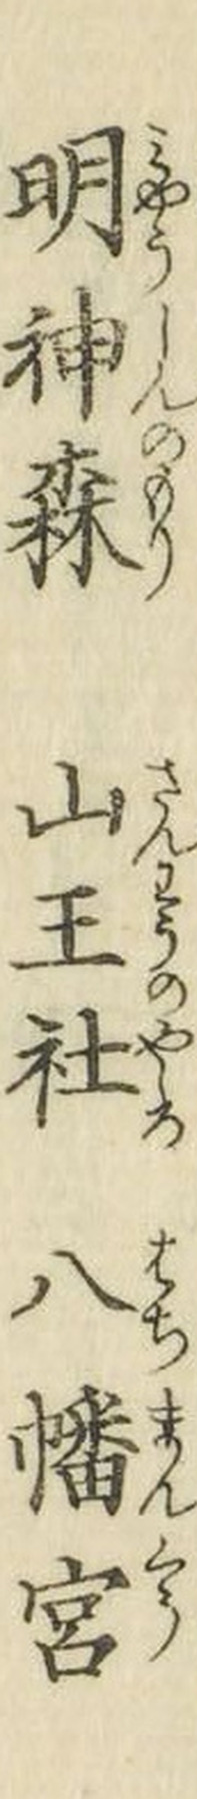明神森山王社八幡宮
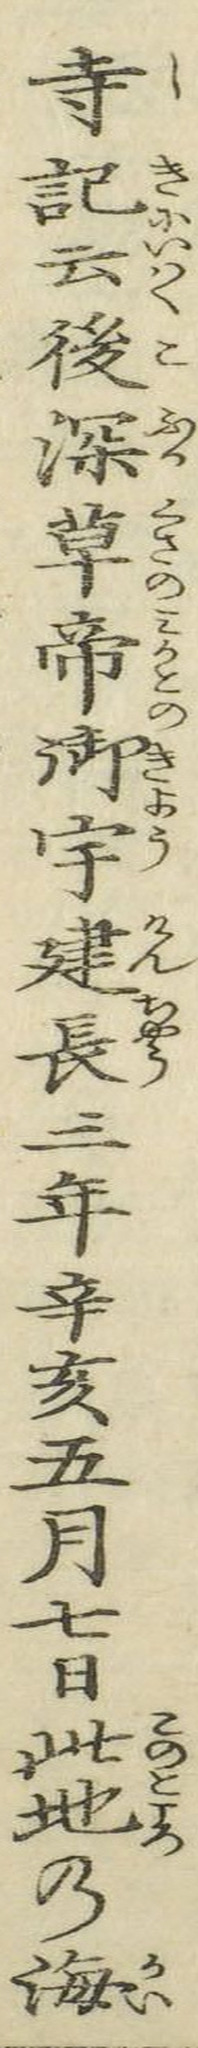寺記云後深草帝御宇建長三年辛亥五月七日此地の海
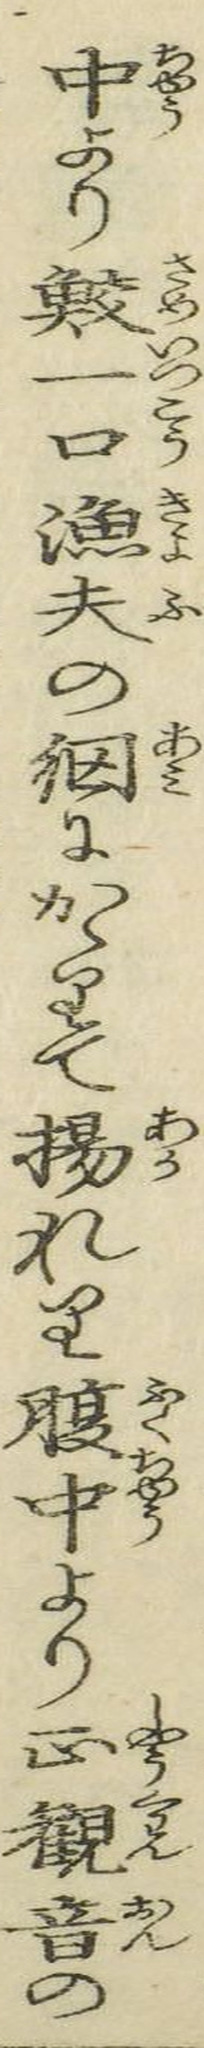中より鮫一口漁夫の纲にかゝりて揚れり腹中より正観音の
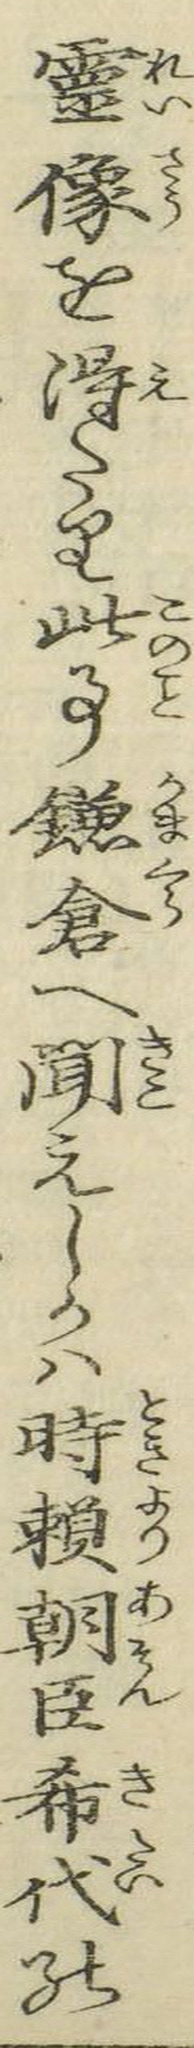靈像を得たり此事鎌倉へ聞えしかは時頼朝臣希代の
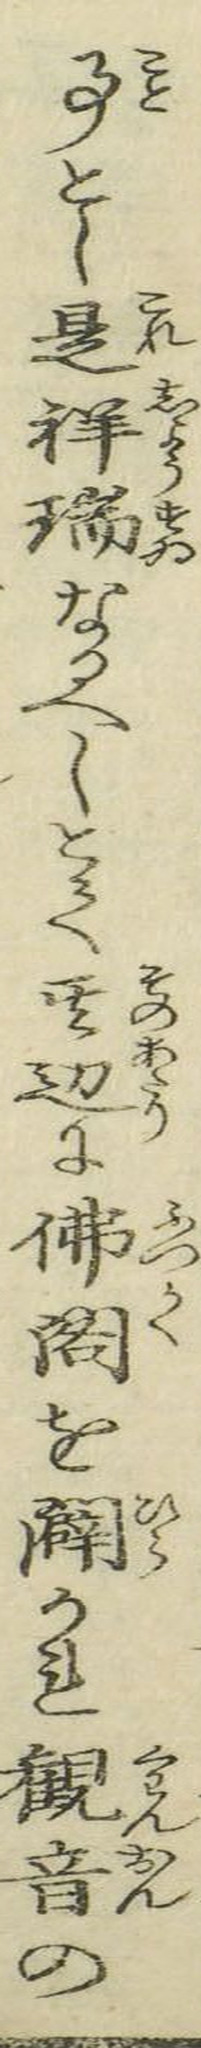事とし是祥瑞なるへしとて其辺に佛閣を闢かれ観音の
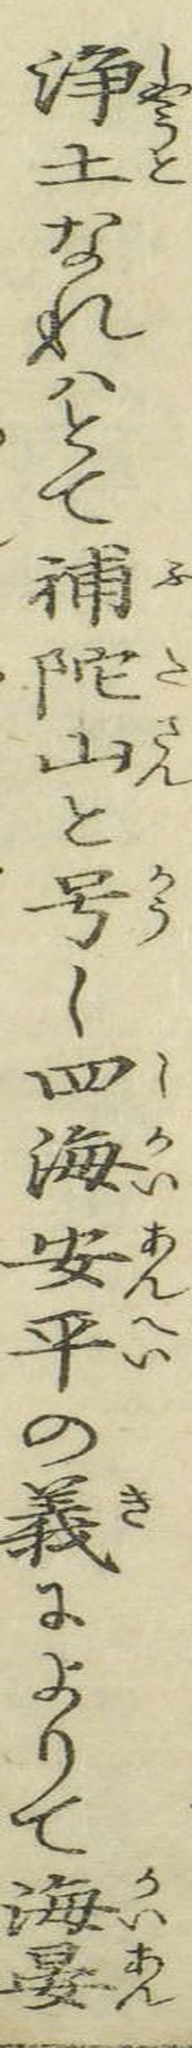浄土なれはとて補陀山と号し四海安平の義によりて海晏
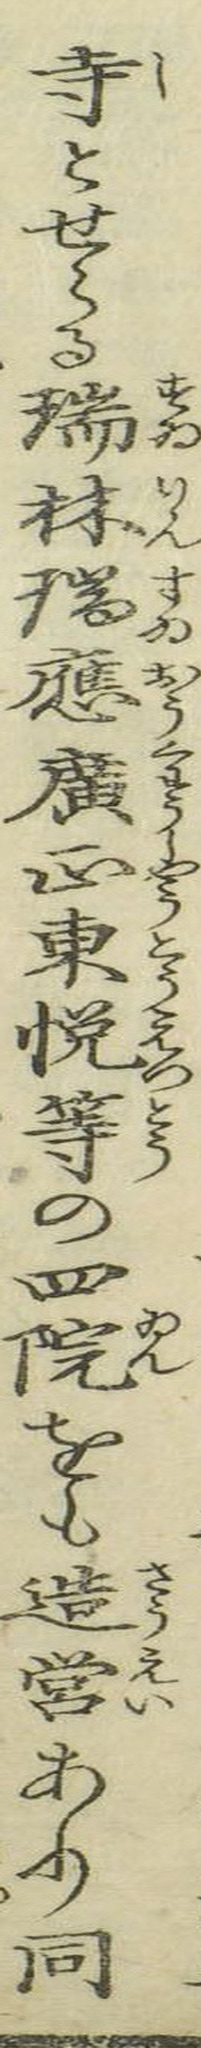寺とせらる瑞林瑞應廣正東悦等の四院をも造営あり同

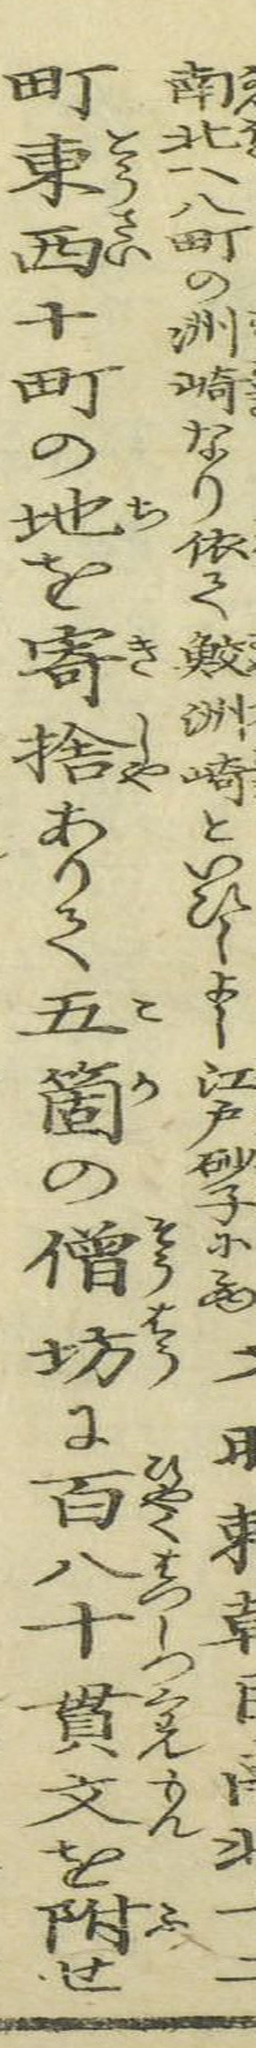町東西十町の地を寄捨ありて五箇の僧坊に百八十貫文を附せ
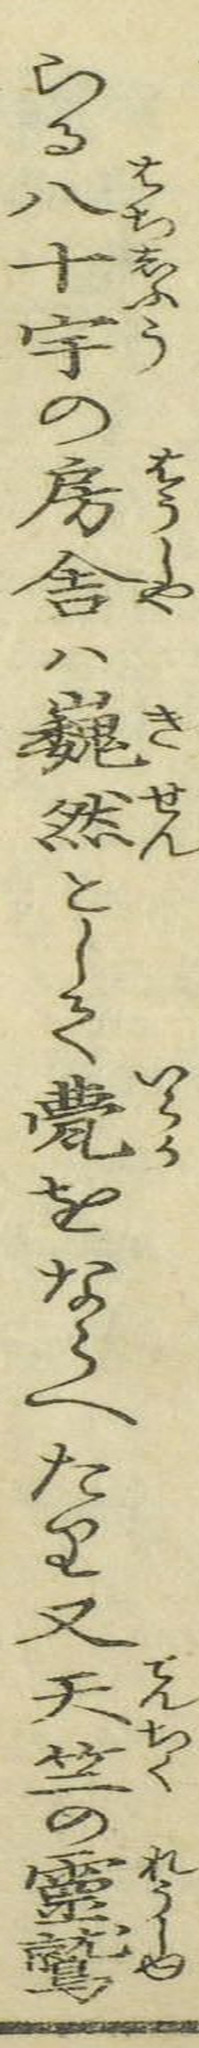らる八十宇の房舎は巍然として甍をならへたり又天竺の靈鷲
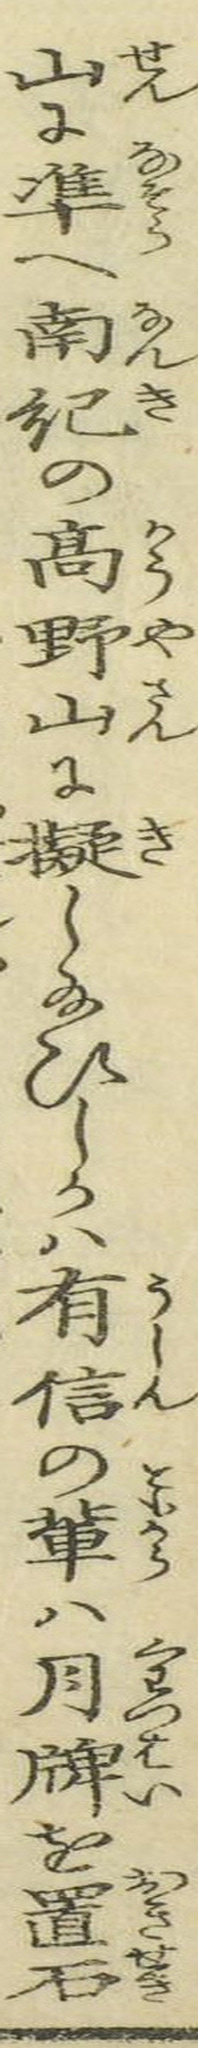山に準へ南紀の髙野山に擬し給ひしかは有信の軰は月牌を置石
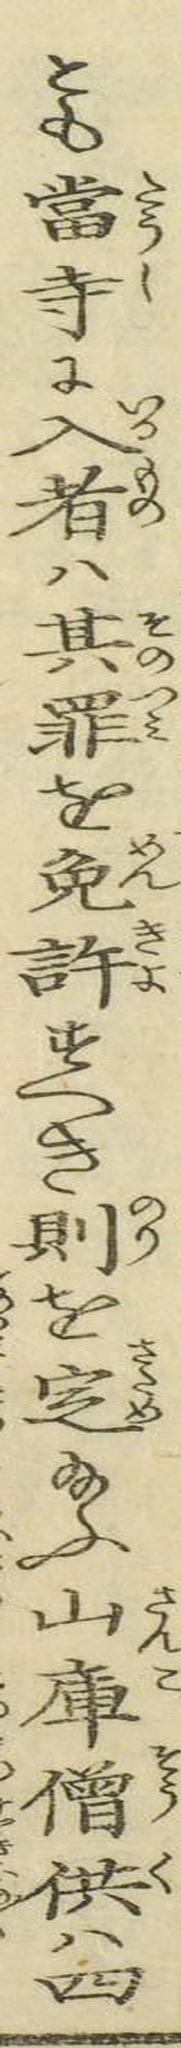とも當寺に入者は其罪を免許すへき則を定給ふ山庫僧供は四
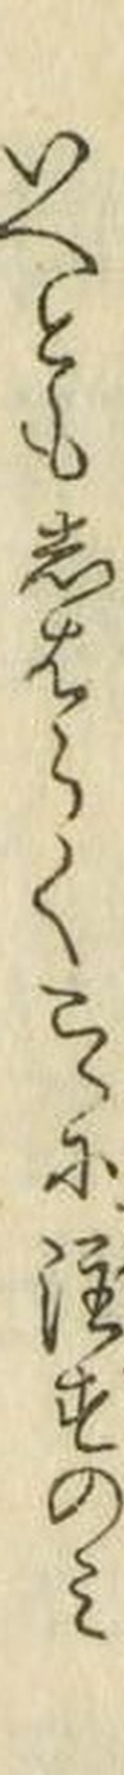いへともしはらくこゝに注すのみ
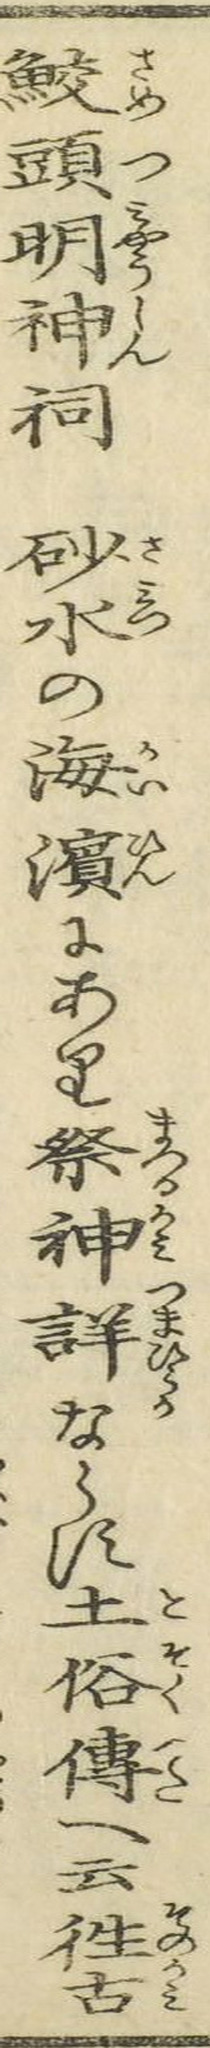鮫頭明神祠砂水の海濵にあり祭神詳ならす土俗傳へ云往古
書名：江戸名所図会 20巻 巻之4
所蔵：東京学芸大学教育コンテンツアーカイブ
